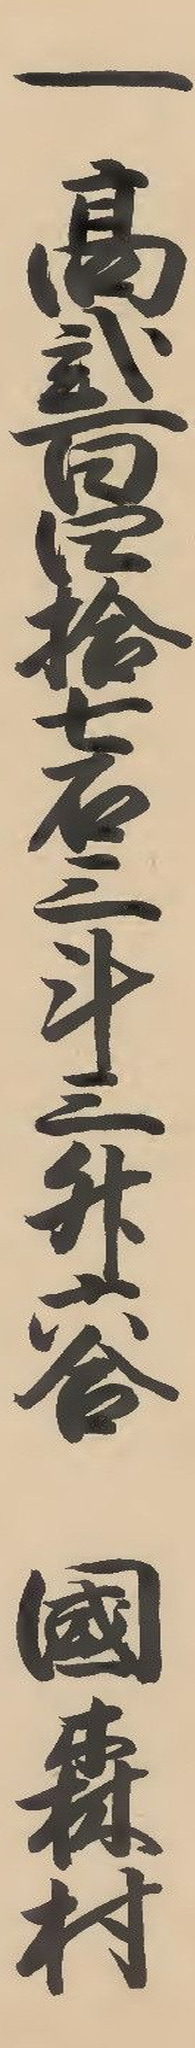一高弐百四拾七石三斗三升六合国森村
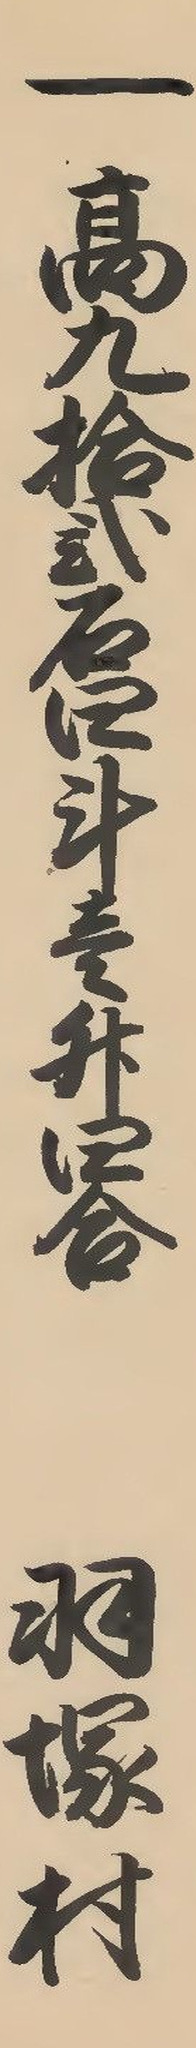一高九拾弐石四斗壱升四合羽塚村
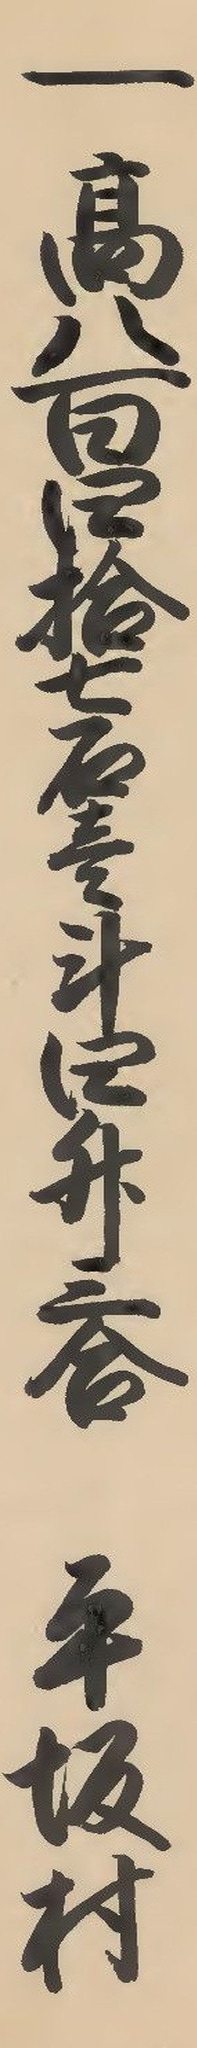一高八百四拾七石壱斗四升三合平坂村
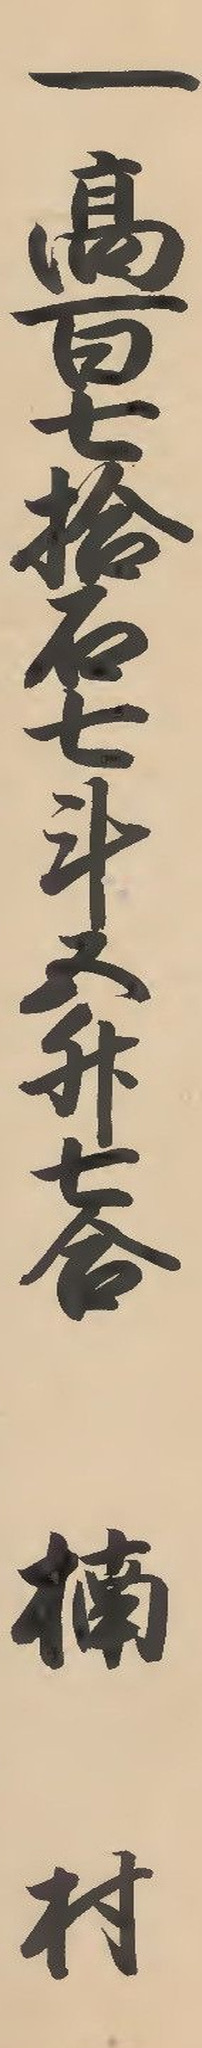一高百七拾石七斗五升七合楠村
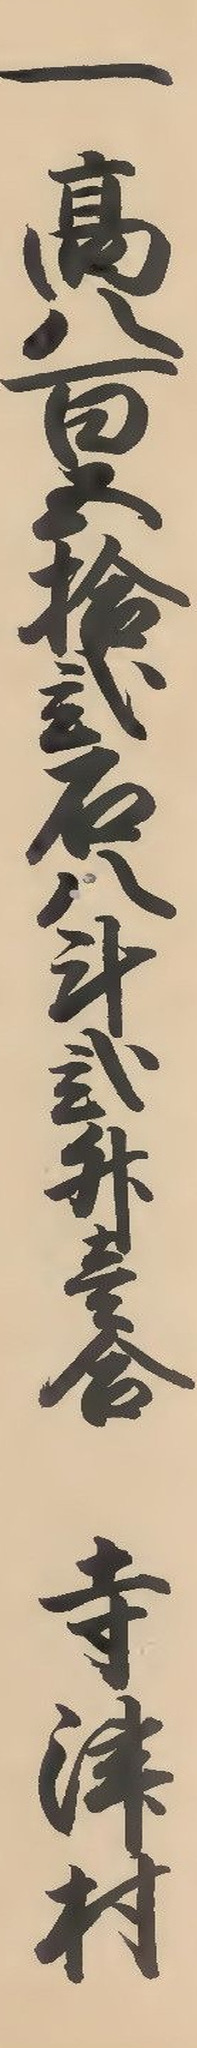一高八百五拾弐石八斗弐升壱合寺津村
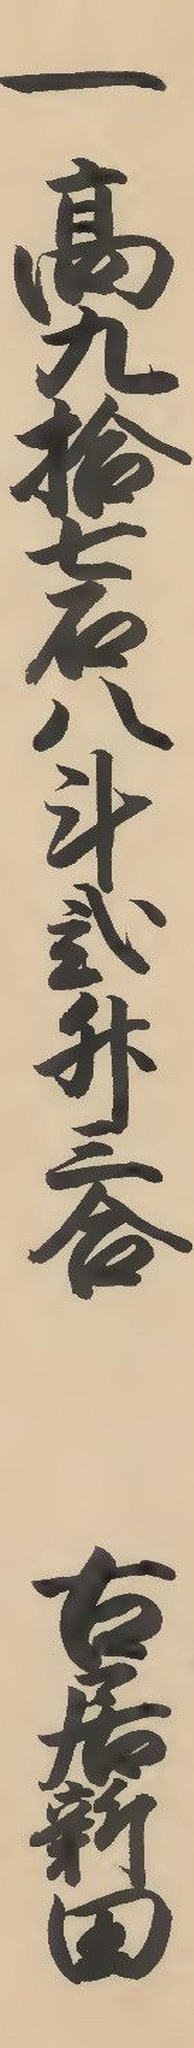一高九拾七石八斗弐升三合古居新田
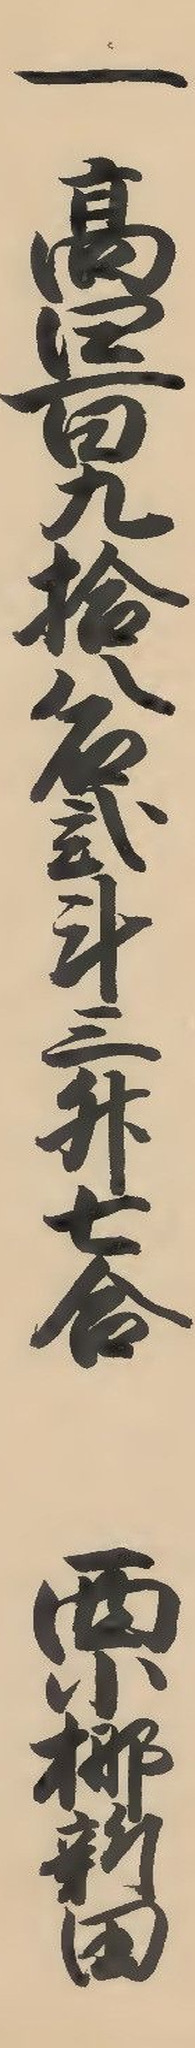一高四百九拾八石弐斗三升七合西小梛新田
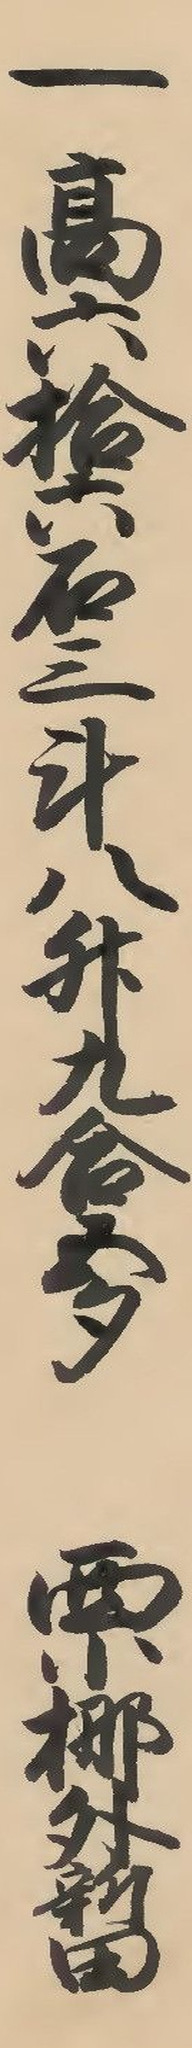一高六拾六石三斗八升九合五勺西小梛外新田

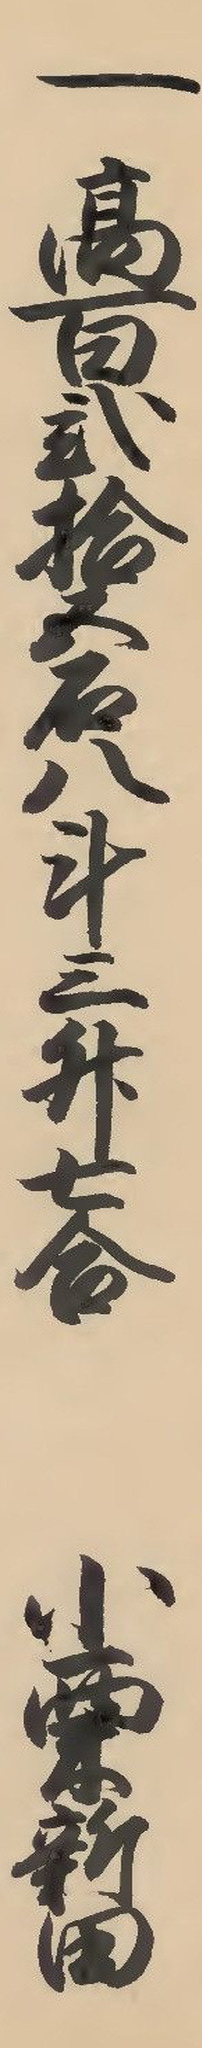一高百弐拾五石八斗三升七合小栗新田
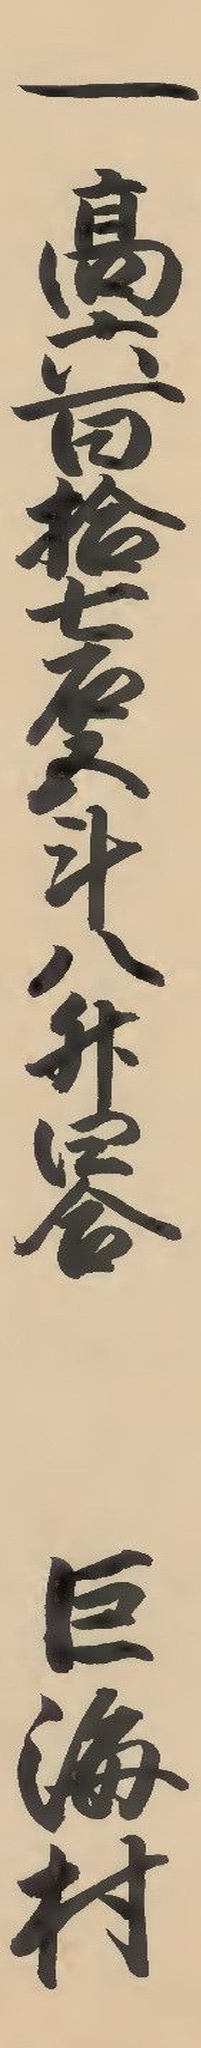一高六百拾七石五斗八升四合巨海村
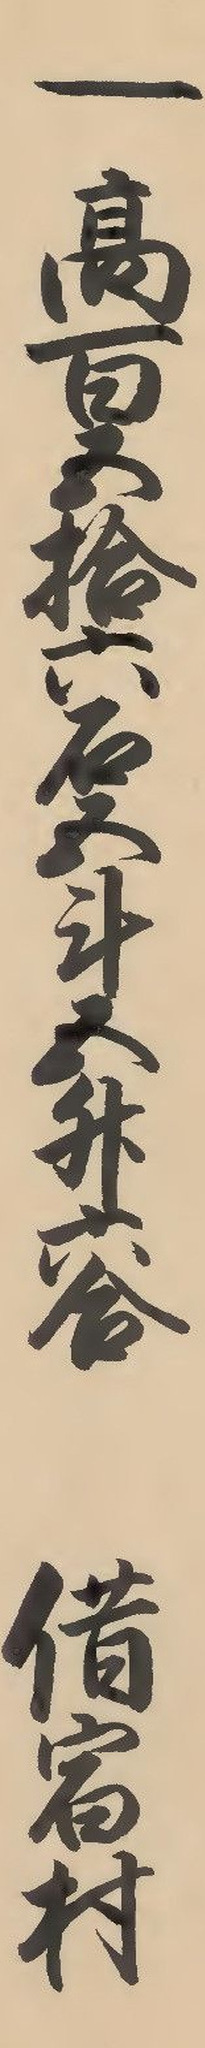一高百五拾六石五斗五升六合借宿村
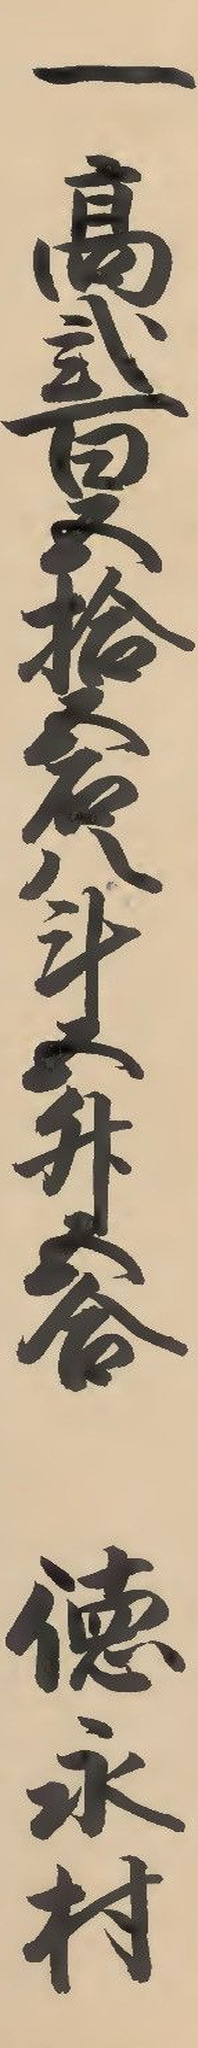一高弐百五拾五石八斗五升五合徳永村
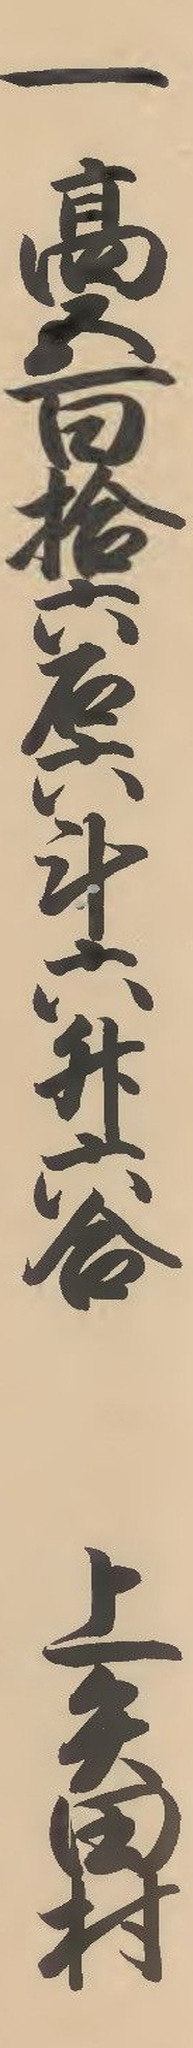一高五百拾六石六斗六升六合上矢田村
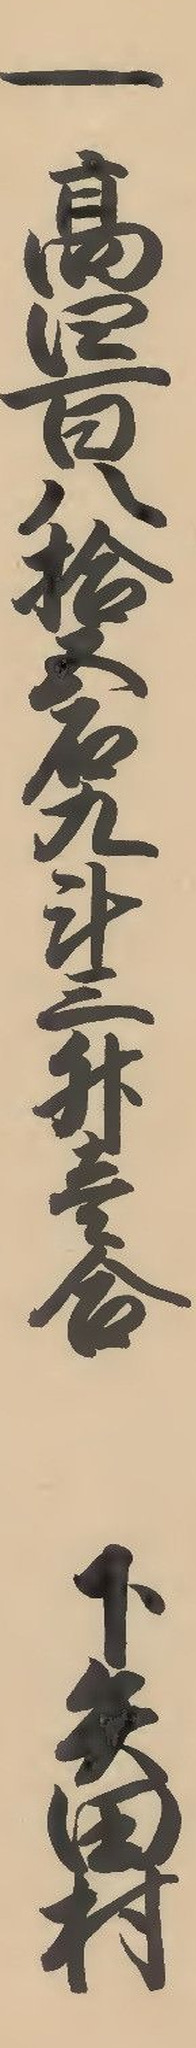一高四百八拾五石九斗三升壱合下矢田村
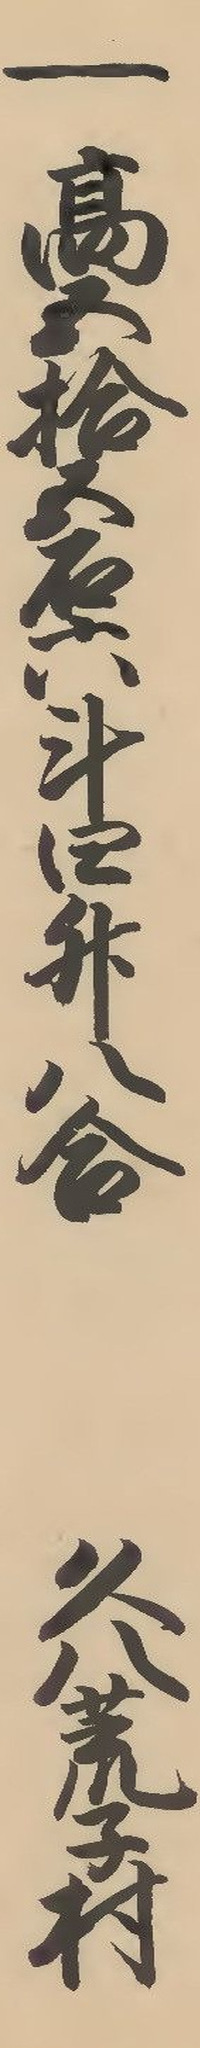一高五拾五石六斗四升八合久八荒子村
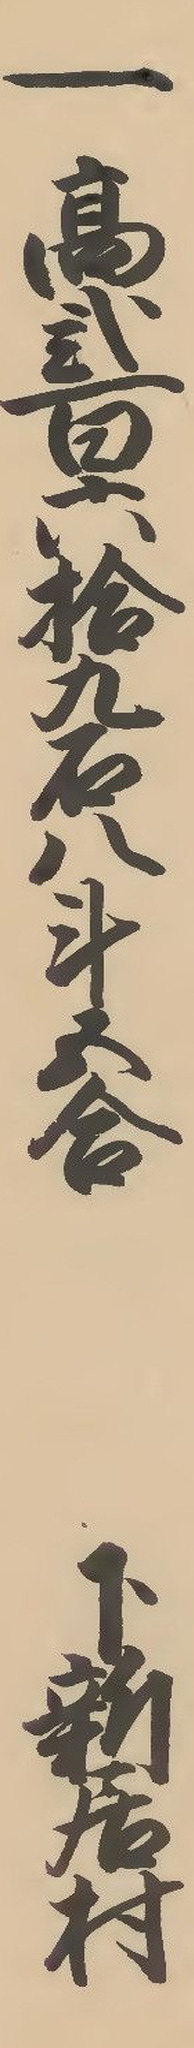一高弐百六拾九石八斗五合下新居村
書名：三河国郷帳
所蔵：国立公文書館 National Archives of Japan
